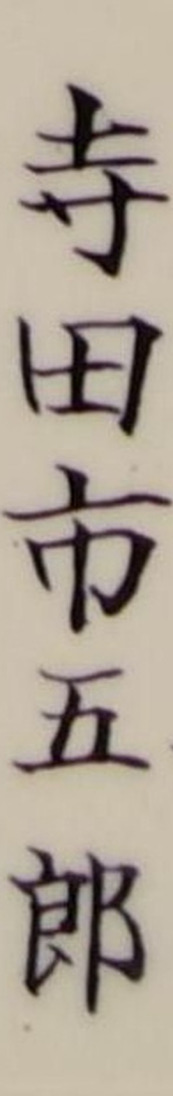寺田市五郎
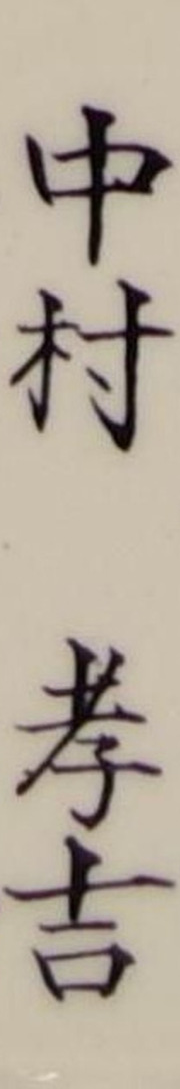中村孝吉
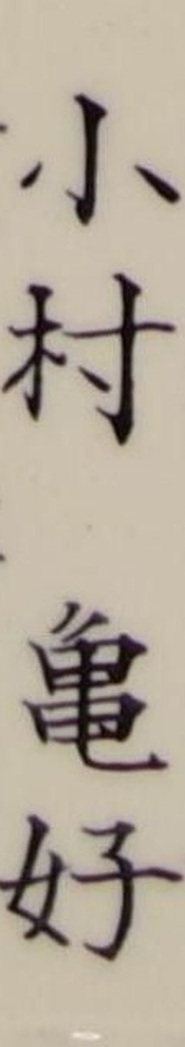小村亀好
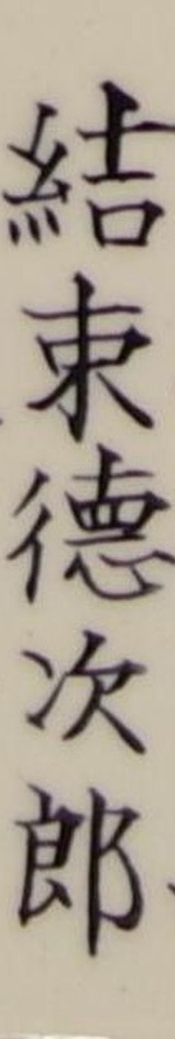結束徳次郎
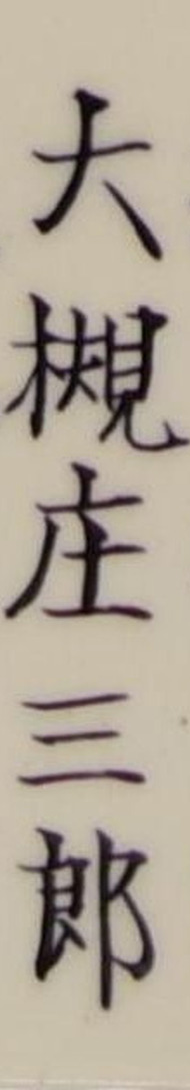大槻庄三郎
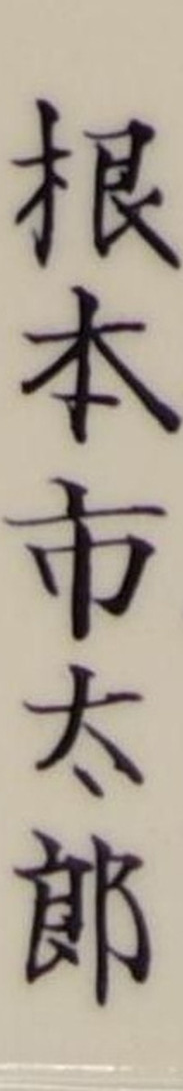根本市太郎
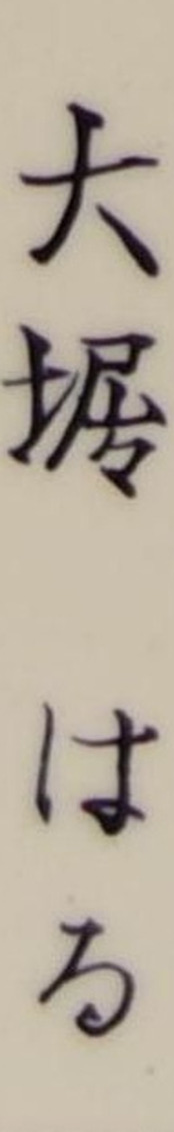大堀はる
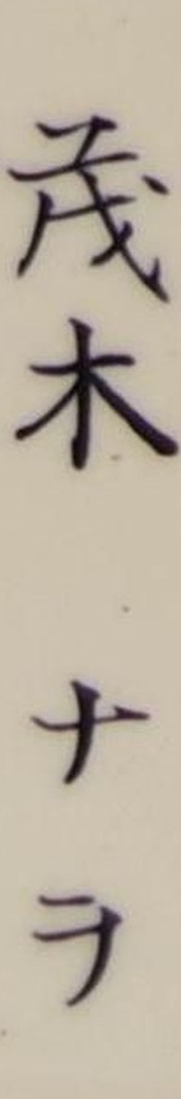茂木ナヲ
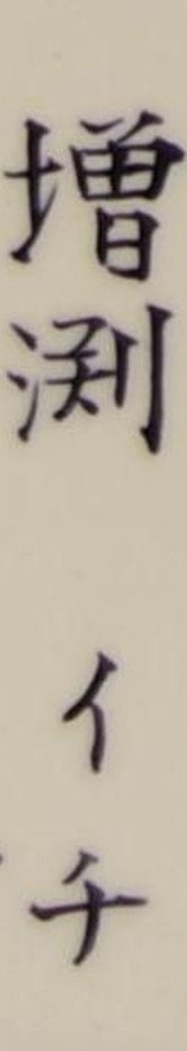増渕イチ
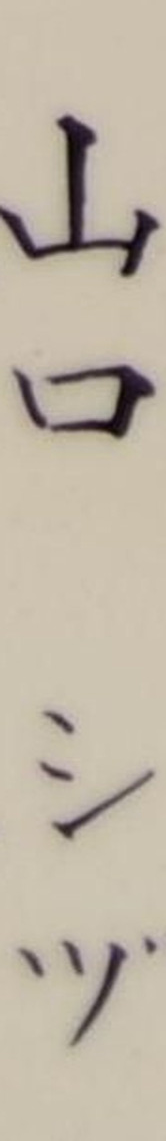山口シヅ
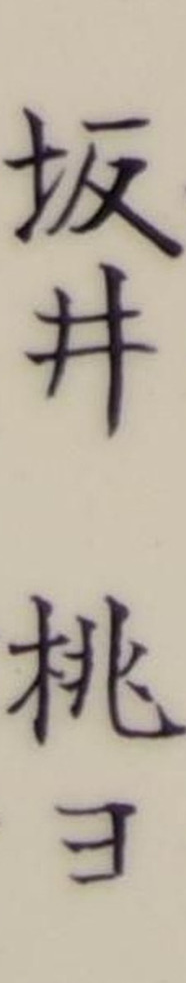坂井桃ヨ
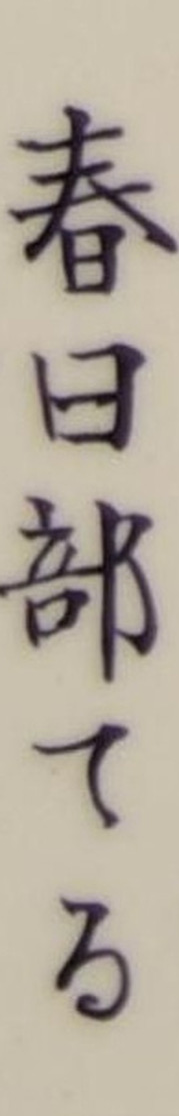春日部てる
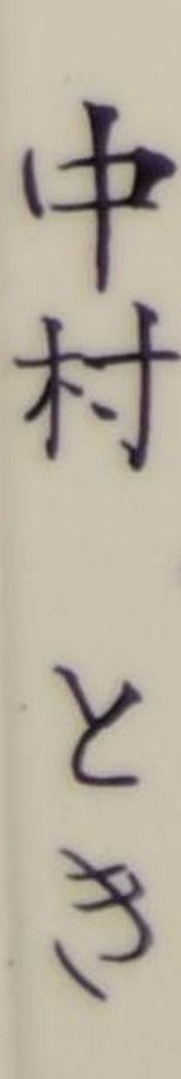中村とき

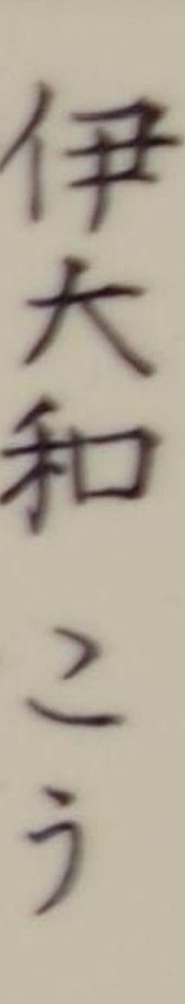伊大和こう
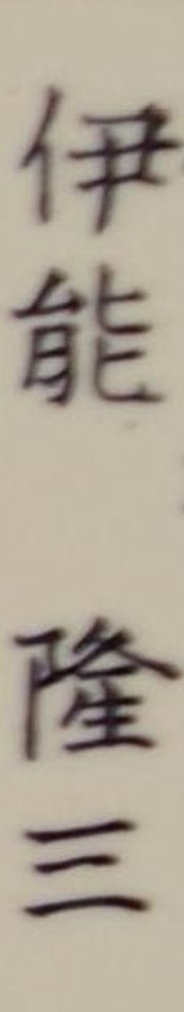伊能隆三
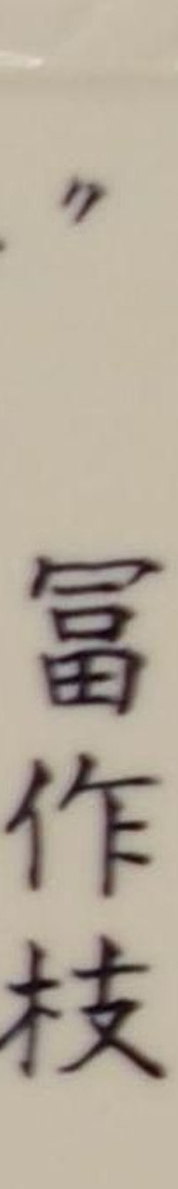冨作枝
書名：M~S
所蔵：高野山金剛峯寺
